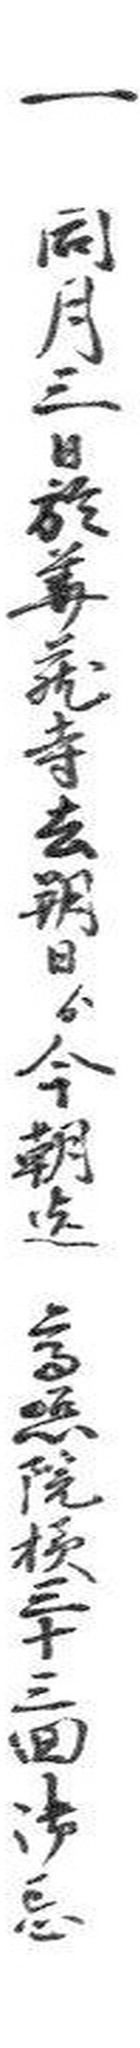一同月三日於華蔵寺去朔日ゟ今朝迄高照院様三十三回御忌
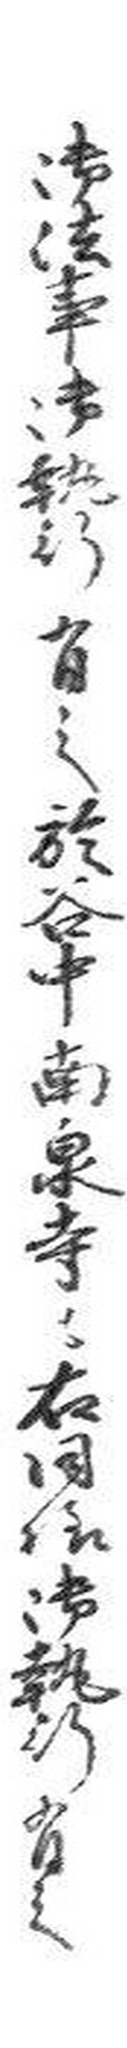御法事御執行有之於谷中南泉寺も右同様御執行有之
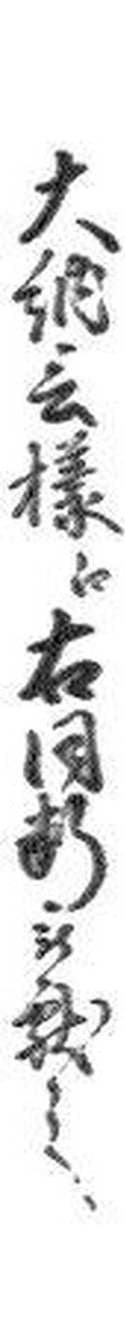大納言様江右同断被献之
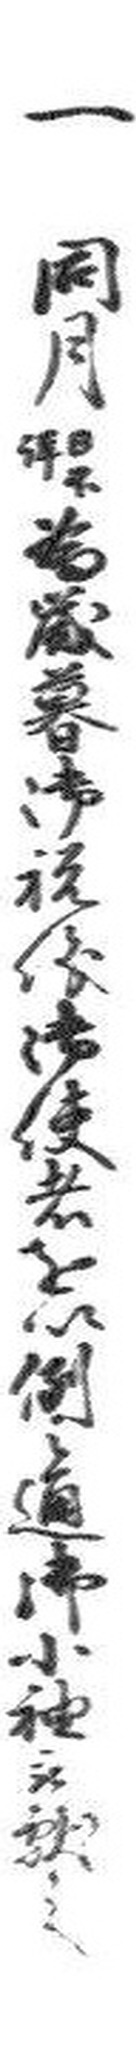詳為歳暮御祝儀御使者を以例之通御小袖被献之
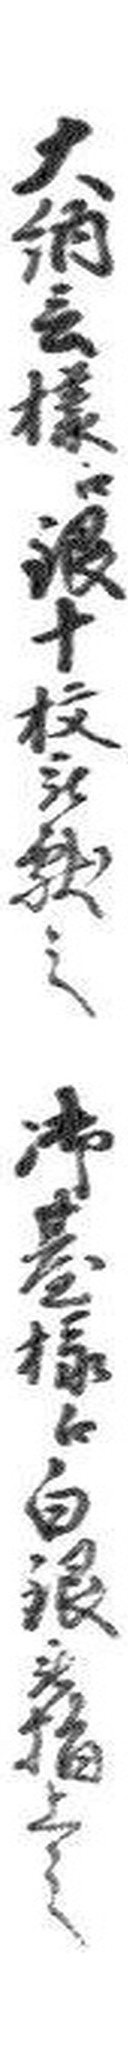大納言様江銀十枚被献之御台様江白銀被指上之
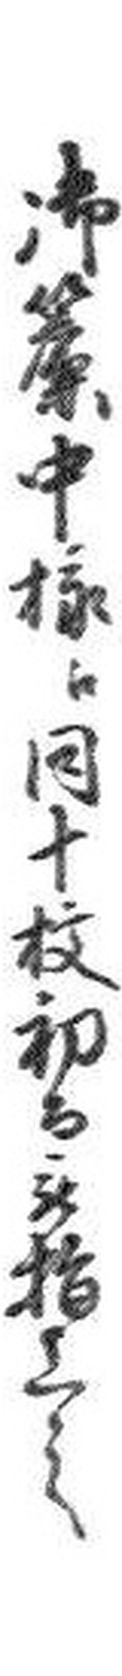御簾中様江同十枚初而被指上之
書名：家譜 二十三 吉品公 従宝永元年到同二年
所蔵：福井県文書館 Fukui Prefectural Archives
